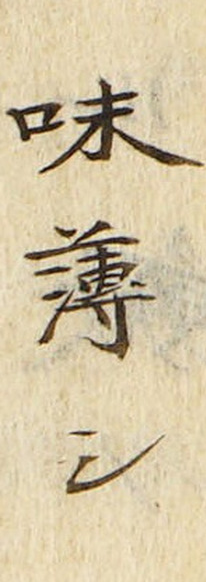味薄シ
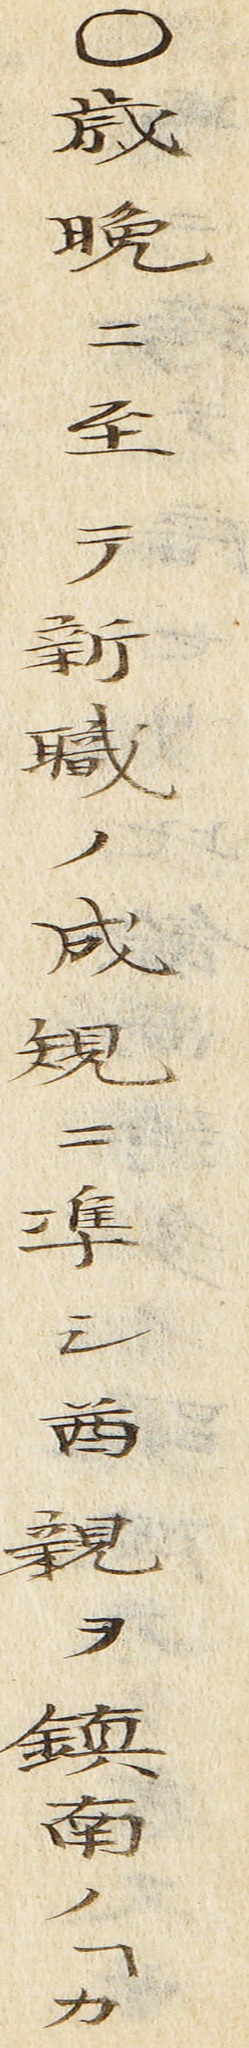○歳晩ニ至テ新職ノ成規ニ凖シ酋親ヲ鎮南ノ「カ
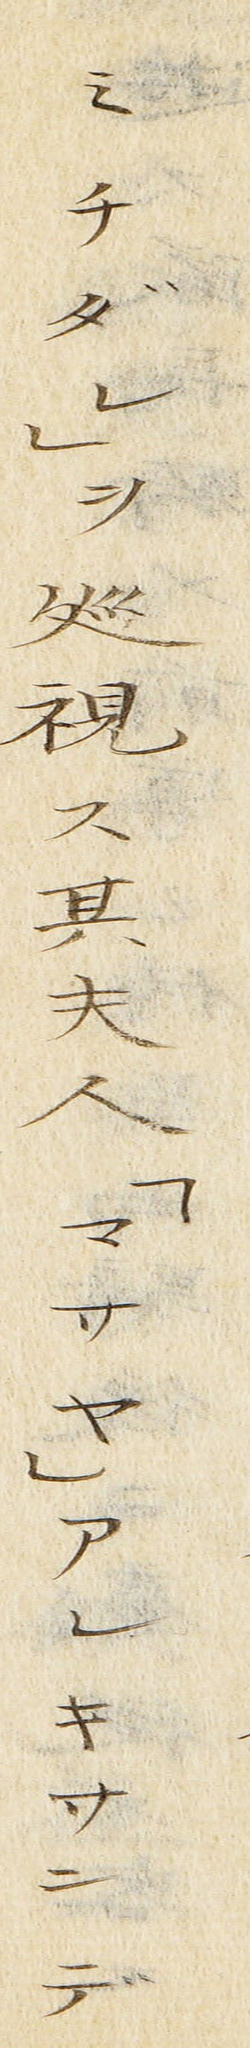ミチダレ」ヲ巡視ス其夫人「マサヤ」アレキサンデ
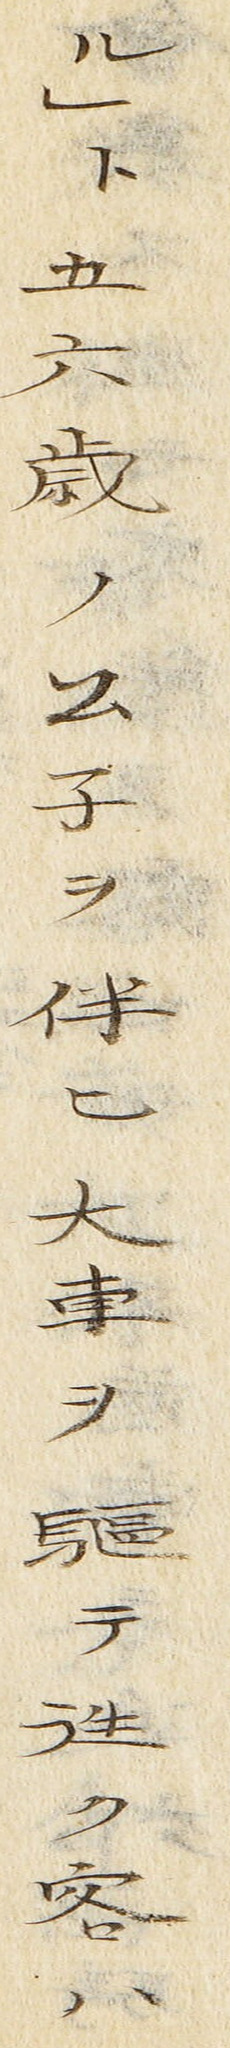ル」ト五六歳ノ公子ヲ伴ヒ大車ヲ駆テ往ク客ハ
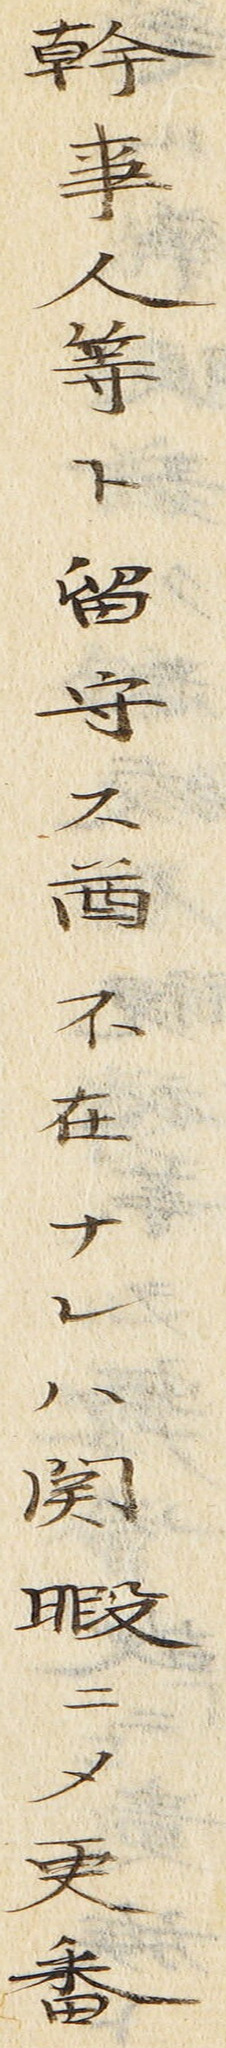幹事人等ト留守ス酋不在ナレハ関暇ニシテ更番
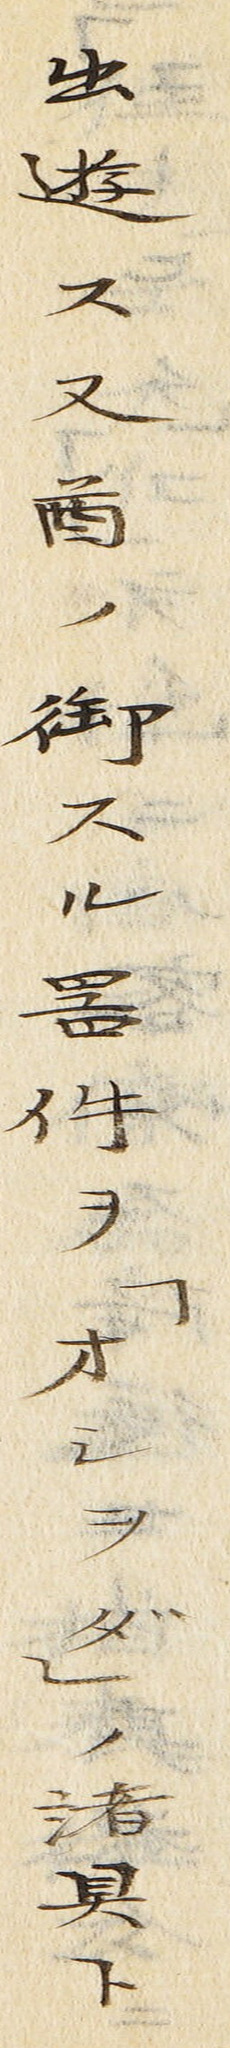出遊ス又酋ノ御スル器件ヲ「オシヲダ」ノ諸具ト
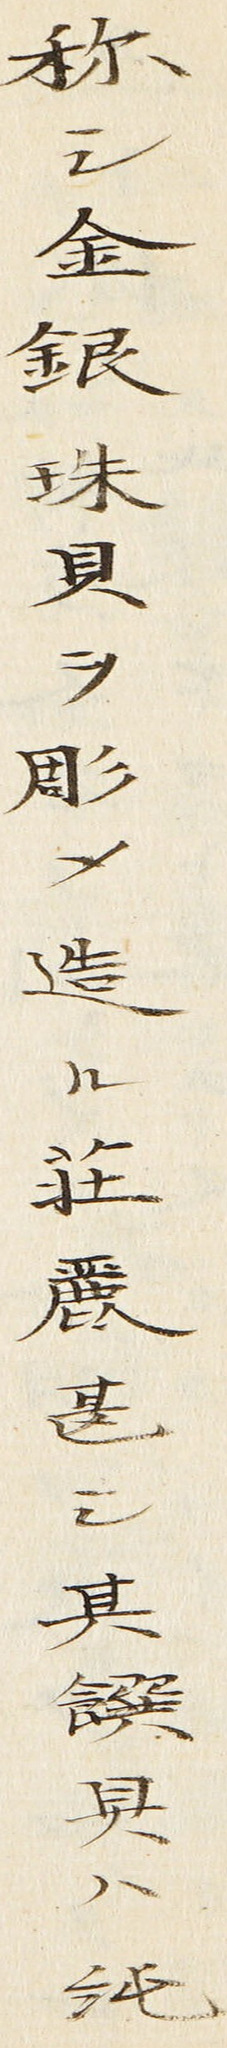称シ金銀珠貝ヲ彫シテ造ル荘麗甚シ其饌具ハ純
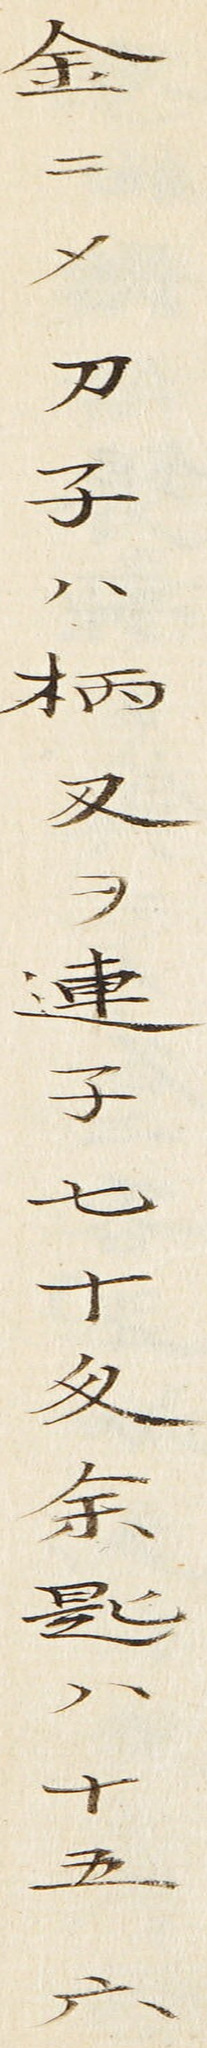金ニシテ刀子ハ柄刄ヲ連子七十匁余匙ハ十五六
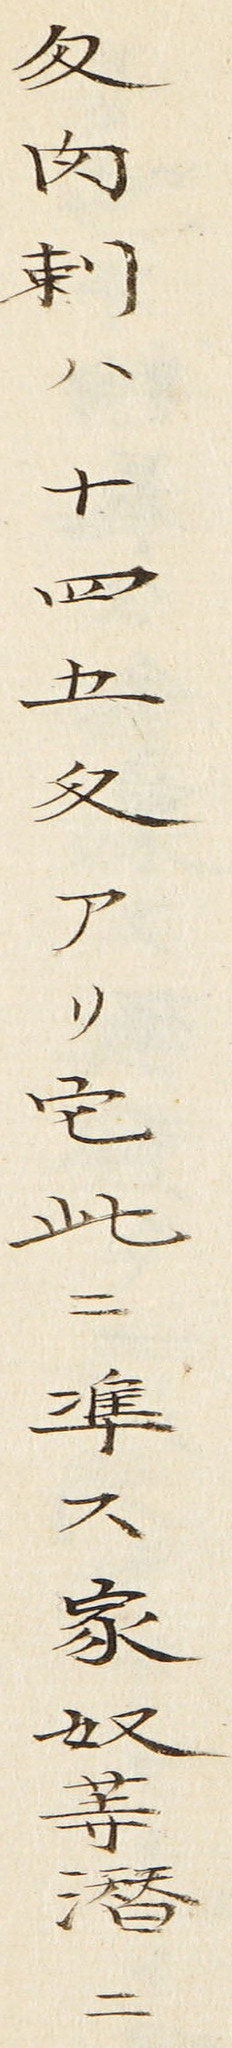匁肉刺ハ十四五匁アリ它此ニ凖ス家奴等潜ニ
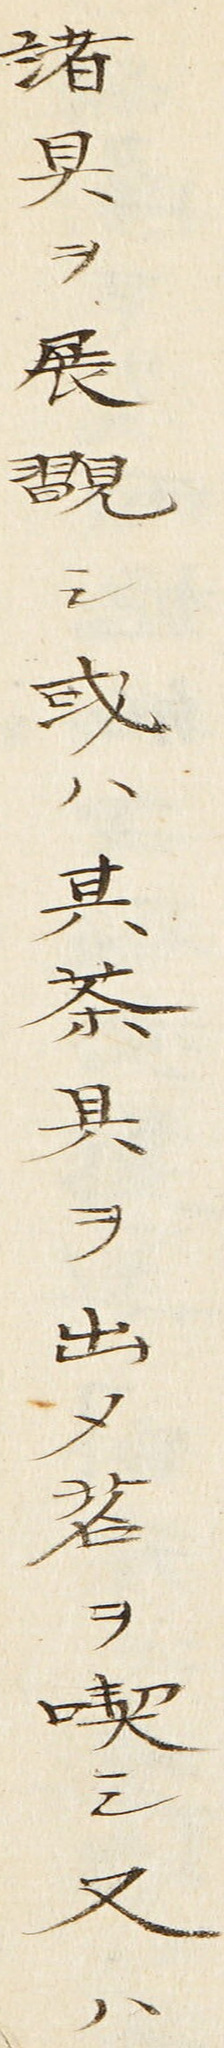諸具ヲ展𧢇シ或ハ其茶具ヲ出シテ茗ヲ喫シ又ハ
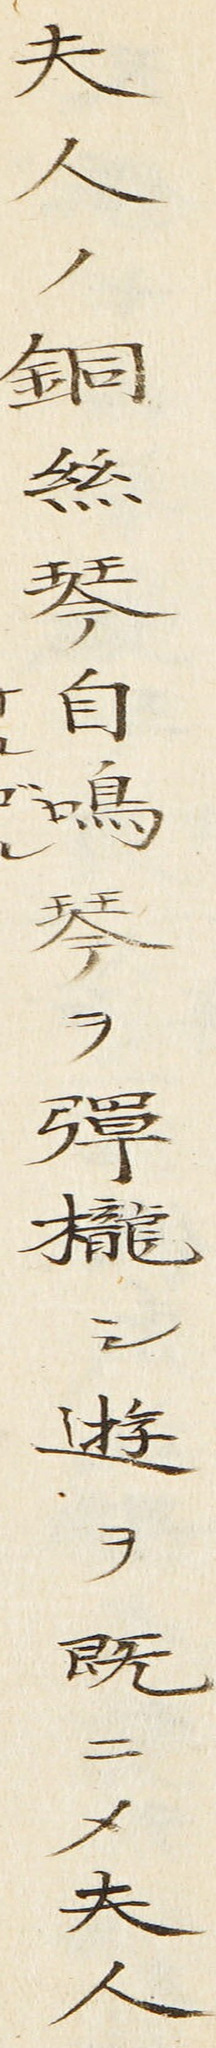夫人ノ銅糸琴自鳴琴ヲ弾攏シ遊ヲ既ニシテ夫人
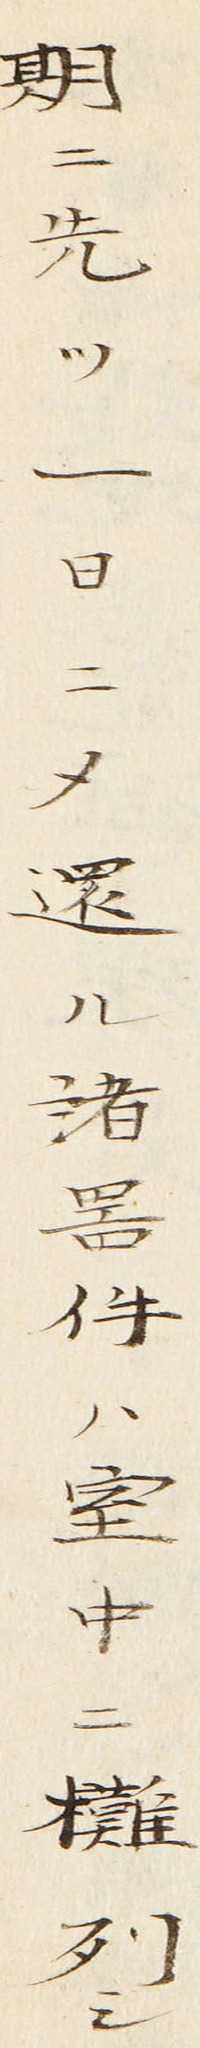期ニ先ツ一日ニシテ遝ル諸器件ハ室中ニ攤列シ
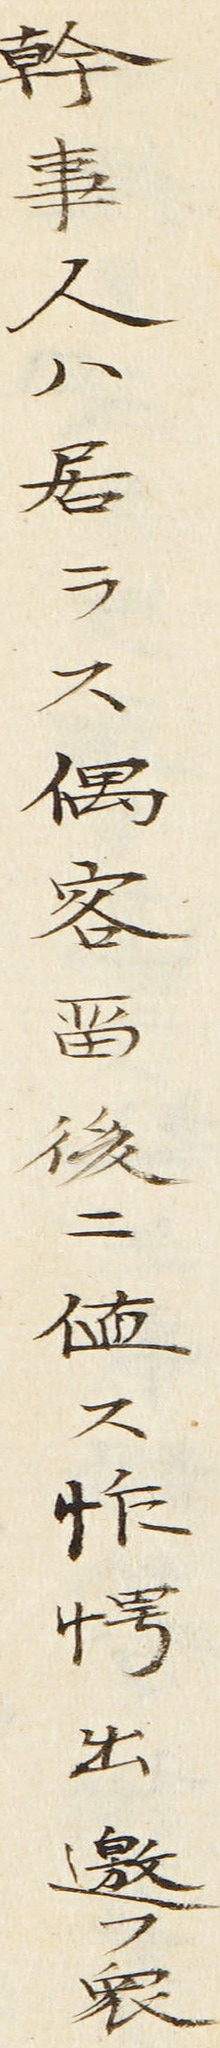幹事人ハ居ラス偶客後ニ値ス怍愕出邀フ衆
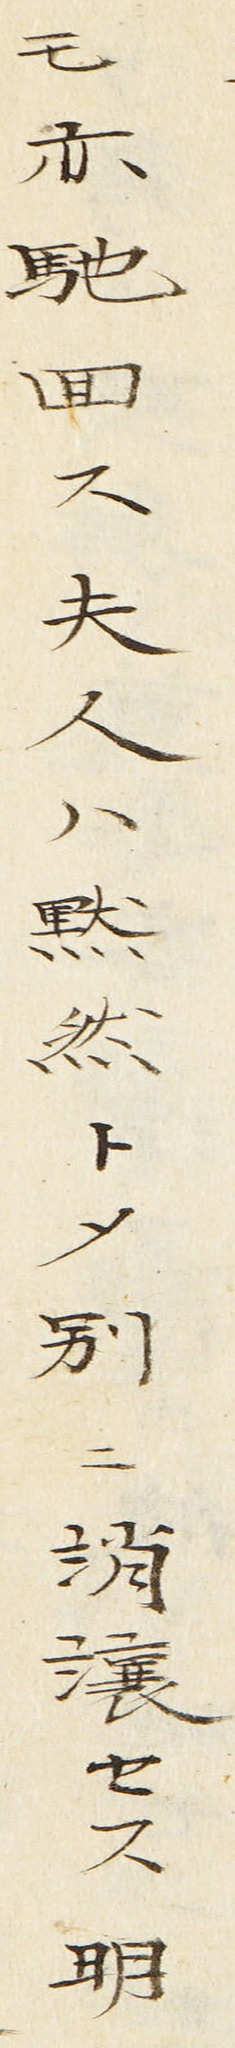モ亦馳回ス夫人ハ黙然トシテ別ニ誚譲セス明
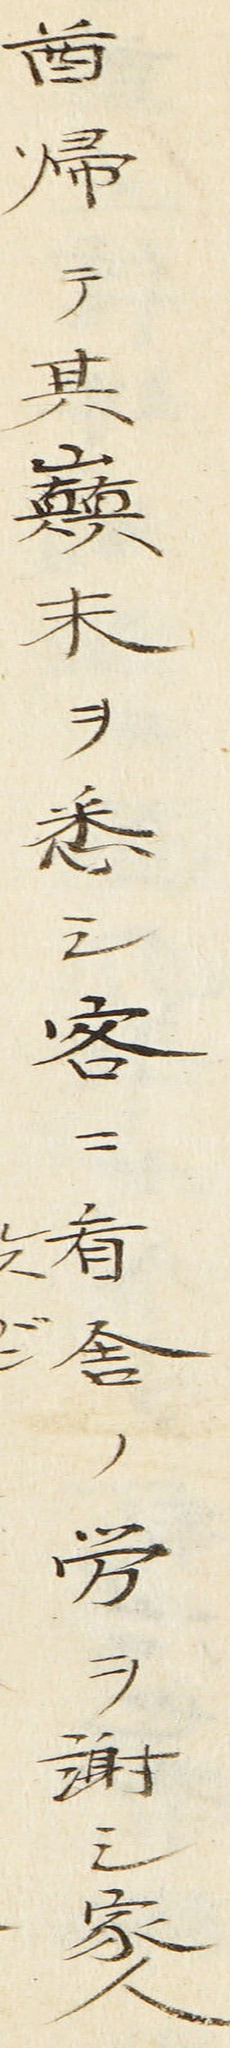酋帰テ其巓末ヲ悉シ客ニ看舎ノ労ヲ謝シ家人
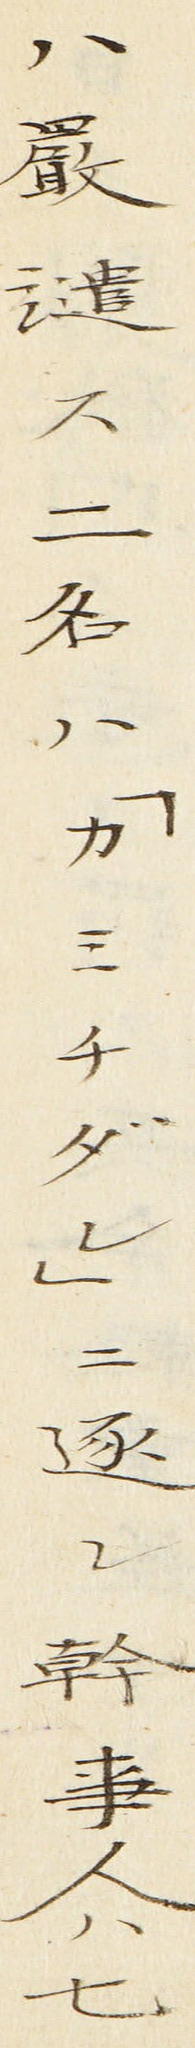ハ厳譴ス二名ハ「カミチダレ」ニ逐レ幹事人ハ七
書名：流蕃通書
